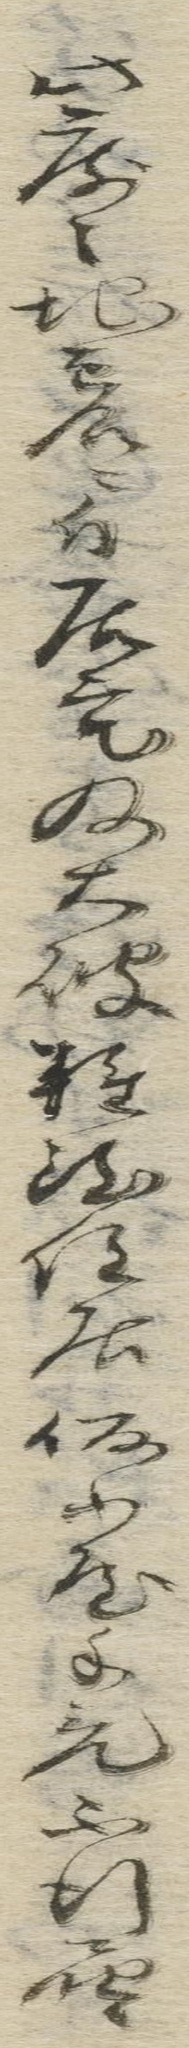此度之地震二付居宅の大破難致住居仮小屋手充不行届
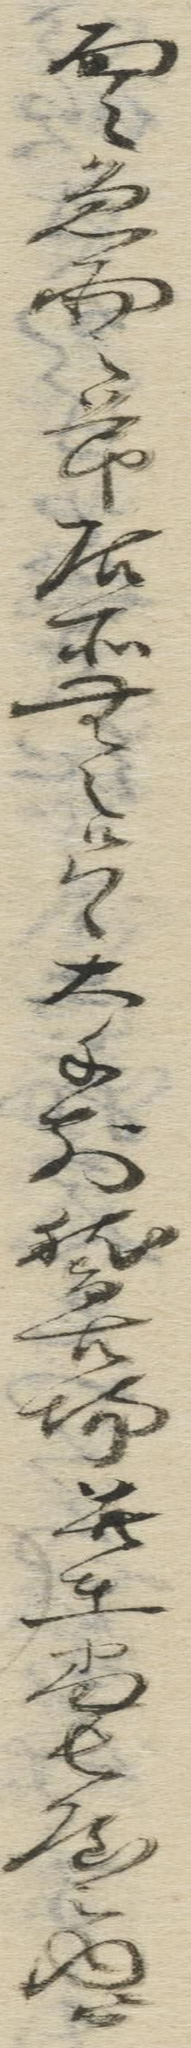面々急雨之節居所無之候ハゝ大手前稽古場并在番長屋之内二而
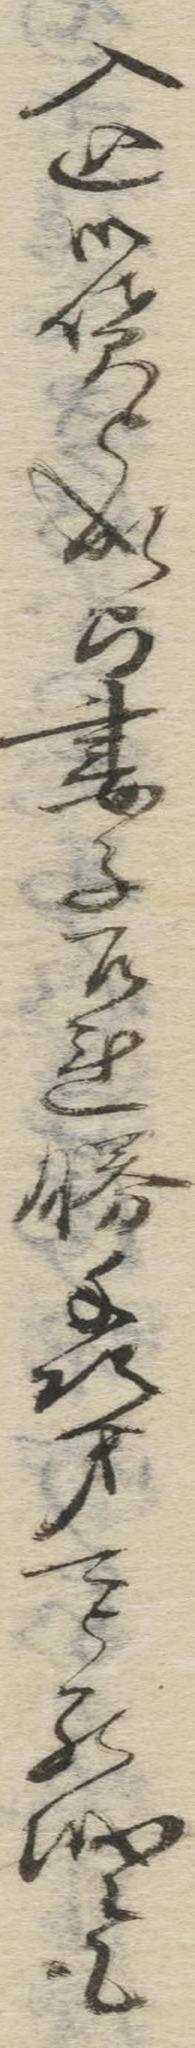入込御貸被成候と妻子召連勝手次第可と罷越候以上
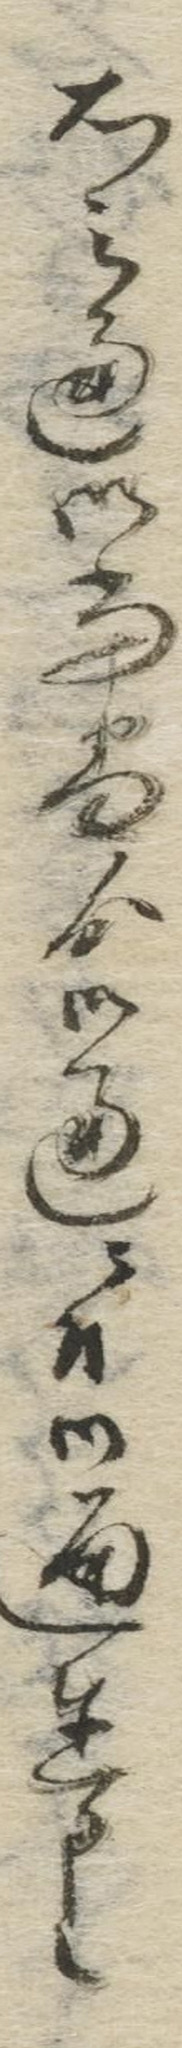右之通御当番ゟ御通二付御通達申候
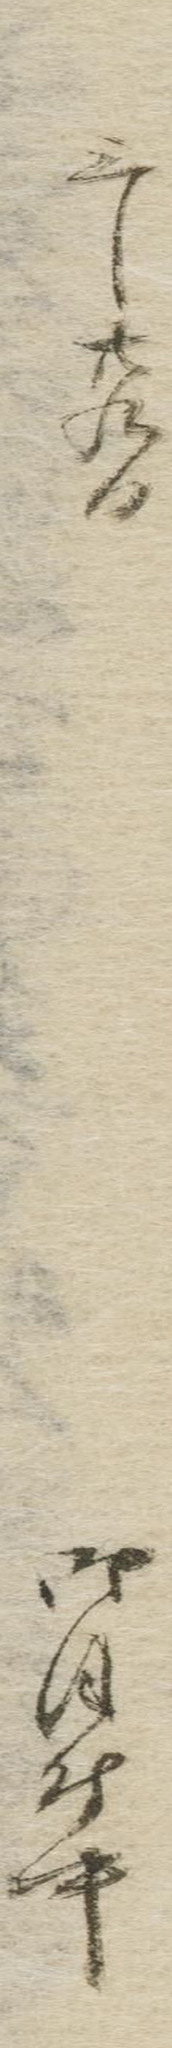三月廿九日御目付中
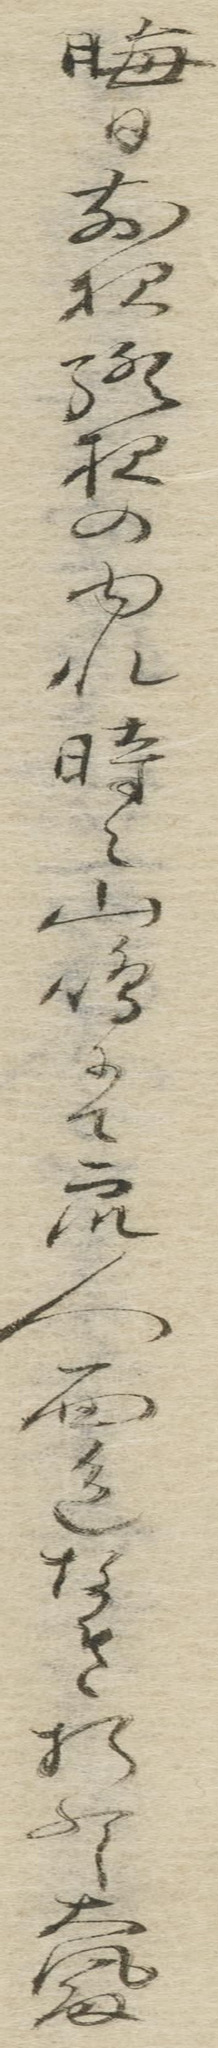晦日前夜終夜のゆれ時々山鳴にて衆人面色なき折ふし大風雨
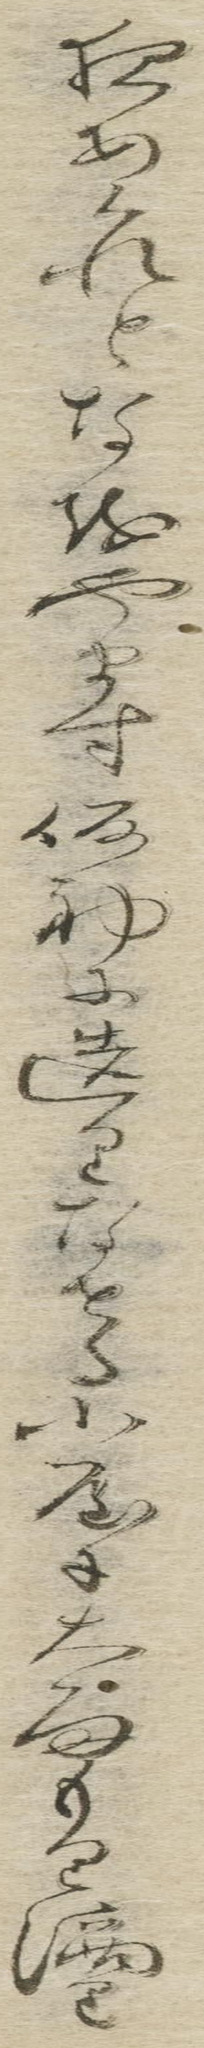夜あくれとなをやます仮初に造りたをる小屋に大雨もり滴り
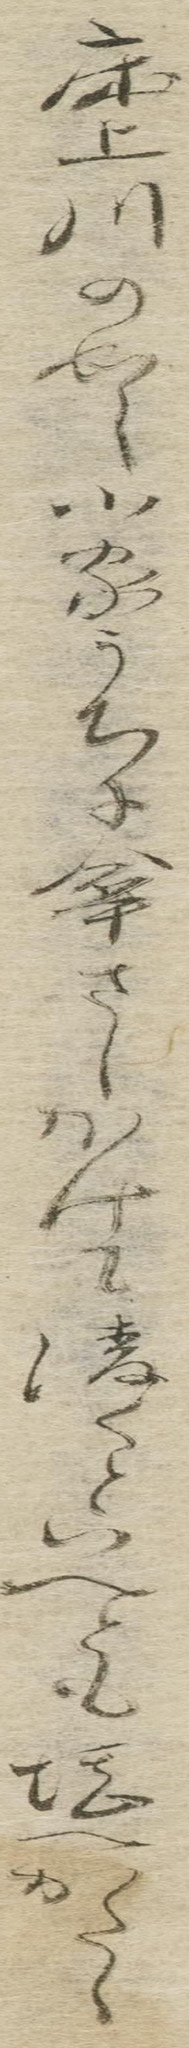床上川の如し小屋うち傘さしかけて凌くといへとも堪へかたし
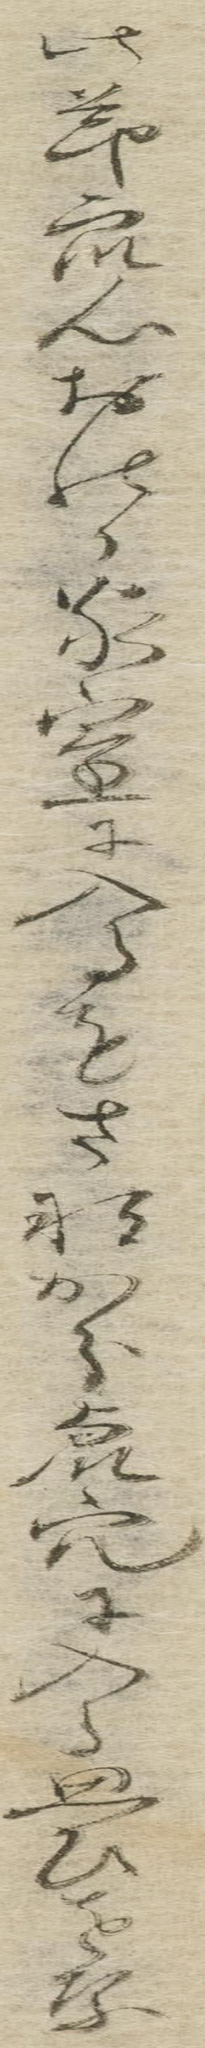此節衆人おの〳〵家室に入るをさなから虎穴に入る思ひをな
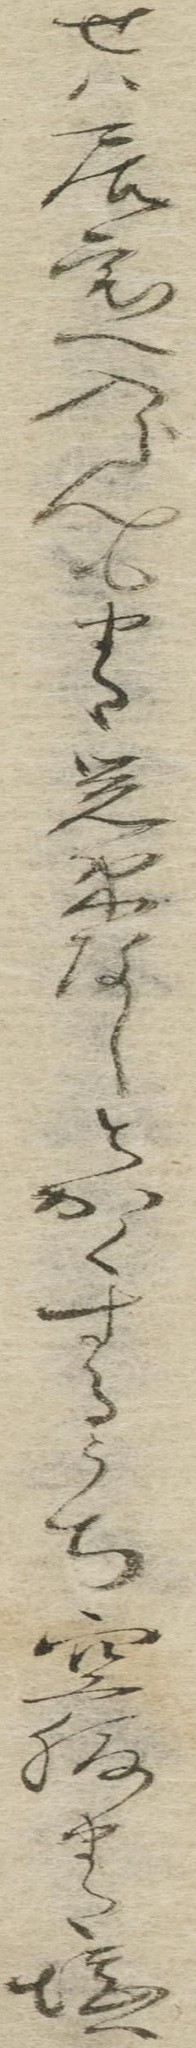せハ居宅へ入らんもまた覚束なしとかくするうち空腹また堪へ
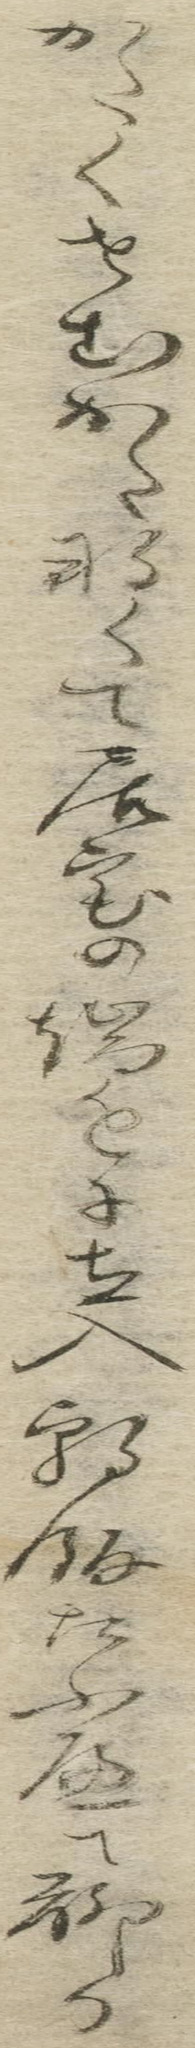かたくやむかたなくて居宅の鍋近に立入朝飯たふへて聊か

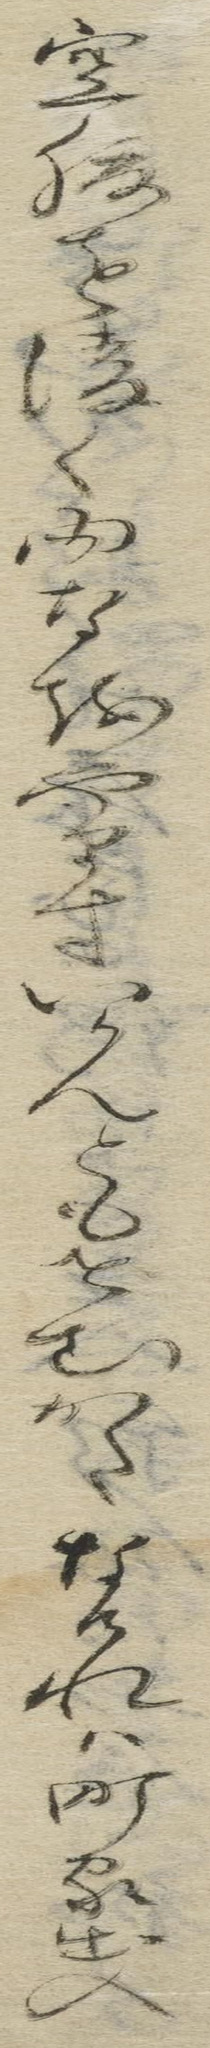空腹を凌ぐ雨なをやますいかんともをむかたなけれハ町家出入
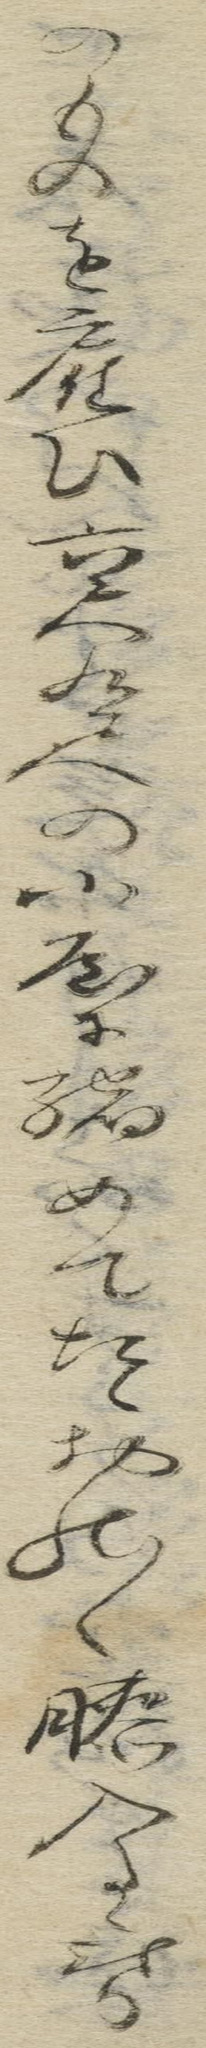のものを雇ひ六尺九尺の小屋に縮めてたゝおの〳〵膝入る計り
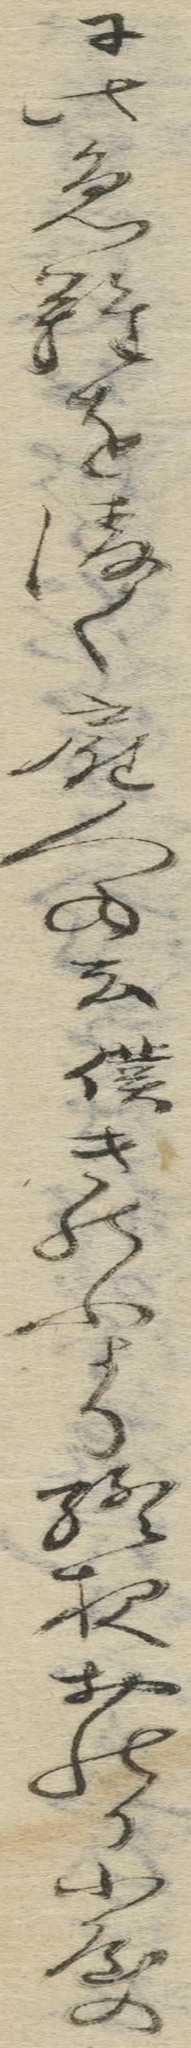に此急難を凌く雇人の云僕きのふより終夜おのか小屋の
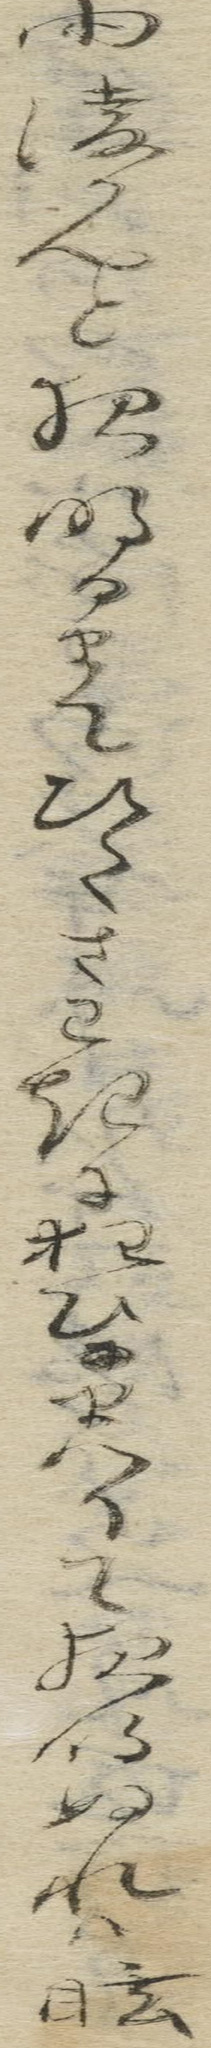雨凌かんと夜明るまてひたさわきに狂ひまハりて夜明ぬれハ眩
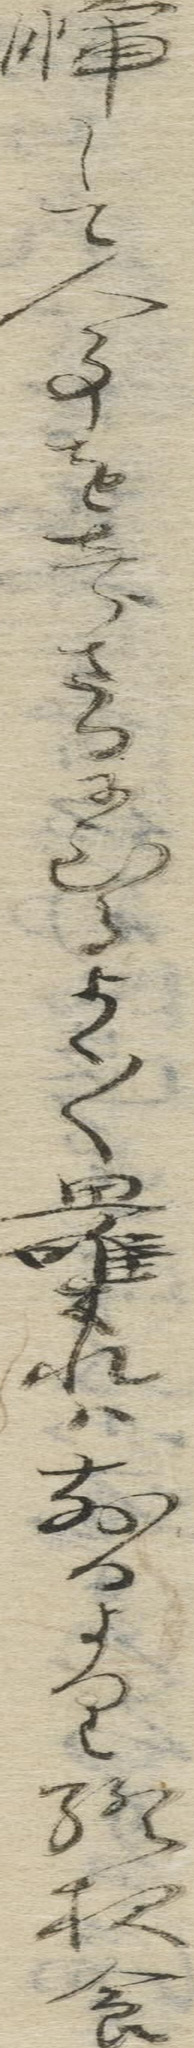暉して人事をしらさるに改るよく〳〵思唯すれハ前日より終夜食
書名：弘化丁未天變日記
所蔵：東京大学地震研究所図書室 Earthquake Research Institute Library, The University of Tokyo, JAPAN
